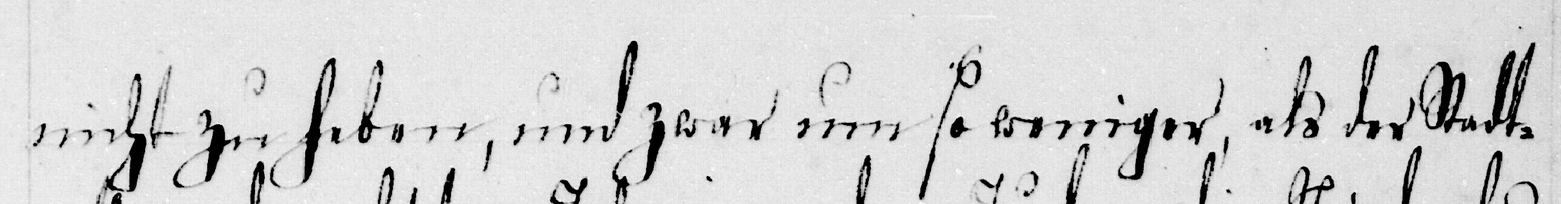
nicht zu heben, und zwar um so weniger, als der Stadt¬
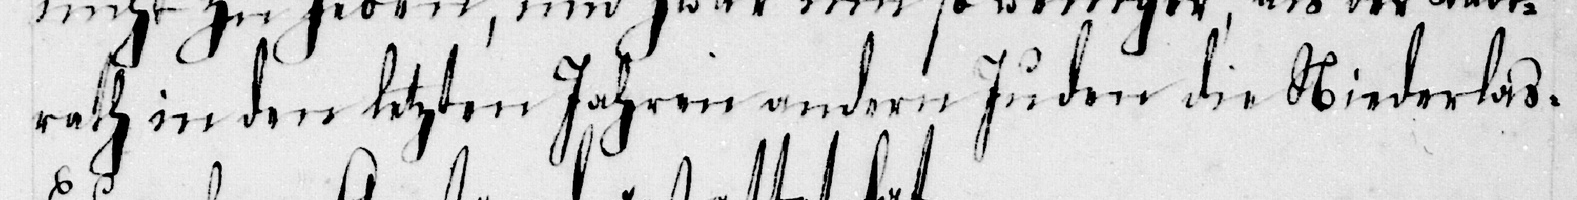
rath in den letzten Jahren andern Juden die Niederlaß¬
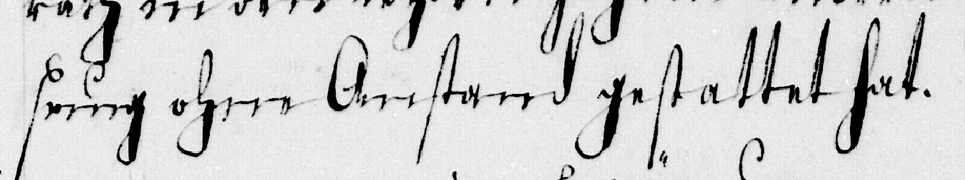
ung ohne Anstand gestattet hat.
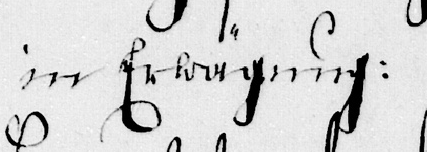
in Erwägung:
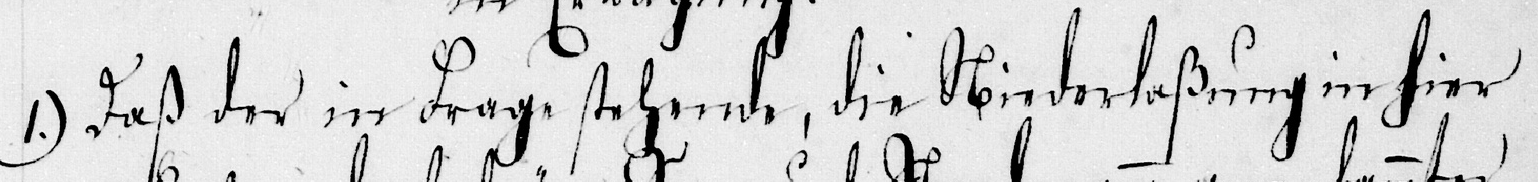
1.) Daß der in Frage stehende, die Niederlaßung in hier
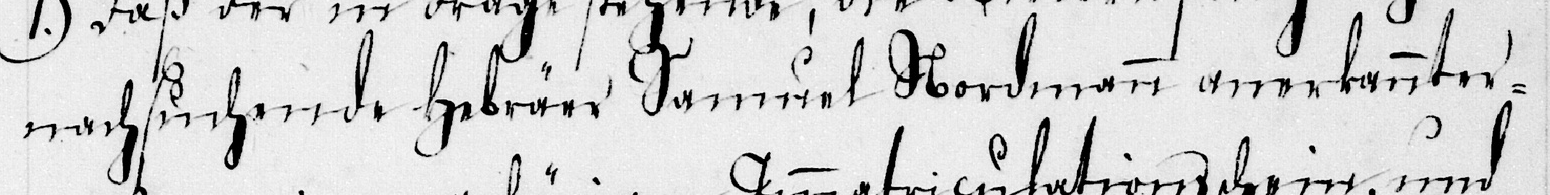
nachsuchende Hebräer Samuel Nordmann anerkannter¬
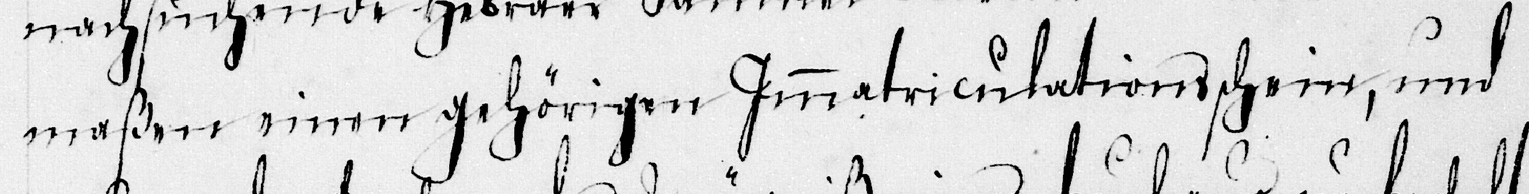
maßen einen gehörigen Immatriculationschein, und
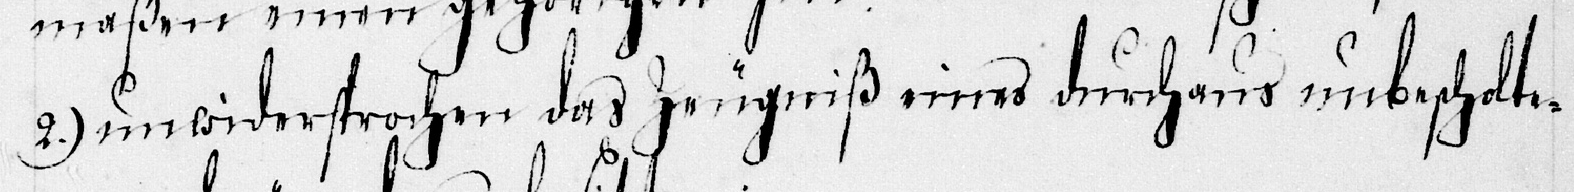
2.) unwidersprochen das Zeugniß eines durchaus unbescholte¬
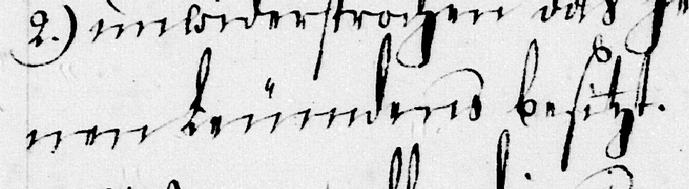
nen Leumdens besitzt.
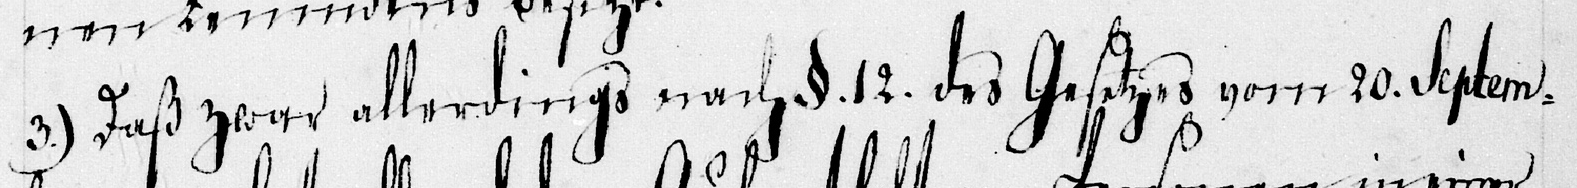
3.) Daß zwar allerdings nach §. 12. des Gesetzes vom 20. Septem¬
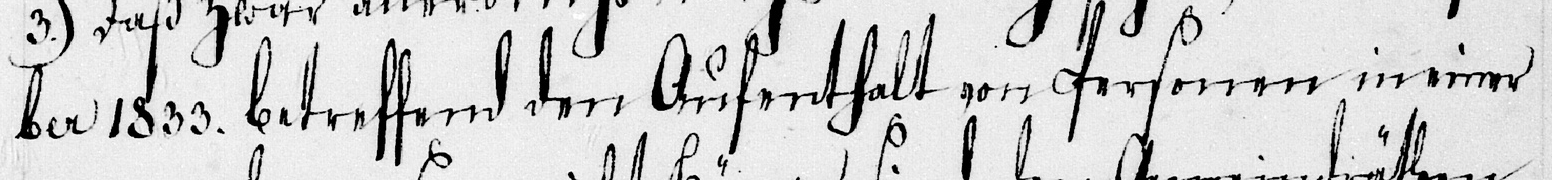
ber 1833. betreffend den Aufenthalt von Personen in einer
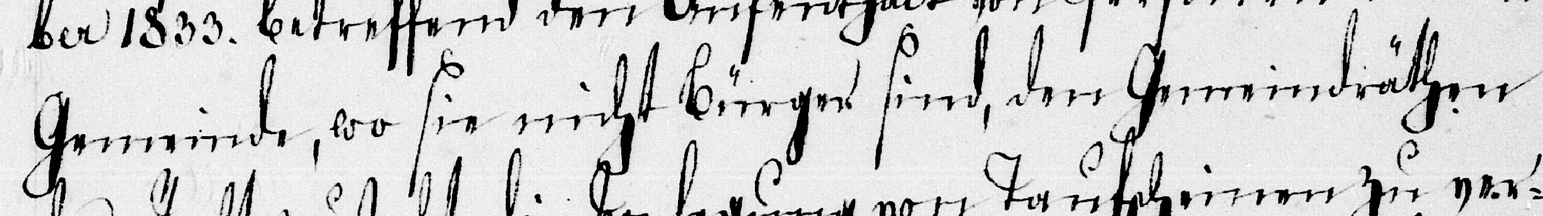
Gemeinde, wo sie nicht Bürger sind, den Gemeindräthen
